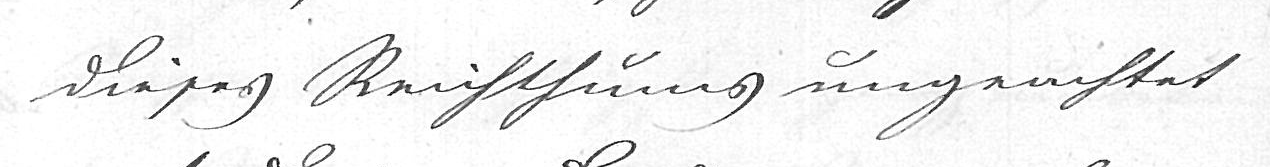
dieses Reichthums ungeachtet
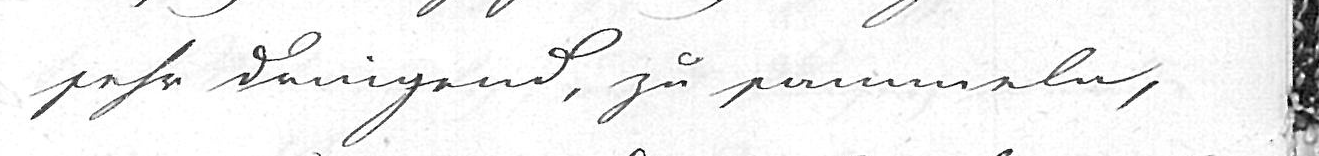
sehr dringend, zu sammeln,
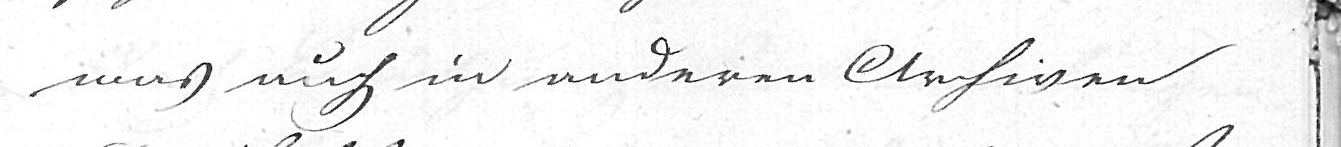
was auch in anderen Archiven
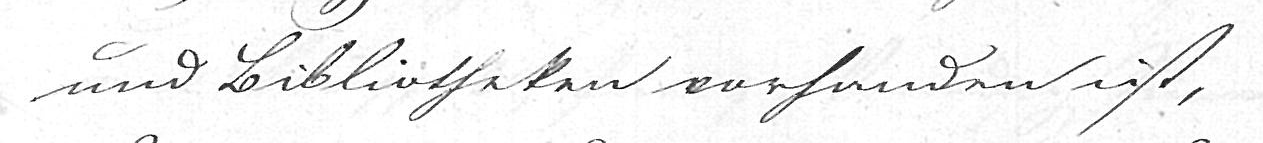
und Bibliotheken vorhanden ist,
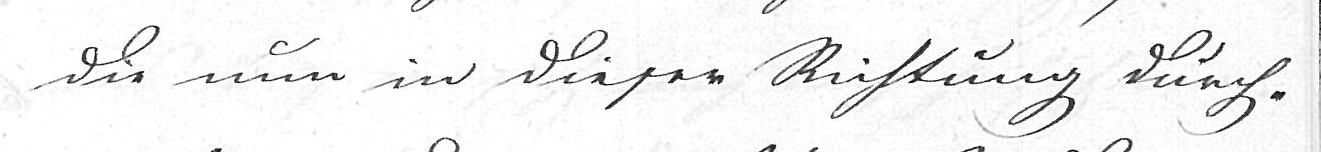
der nun in dieser Richtung durch-
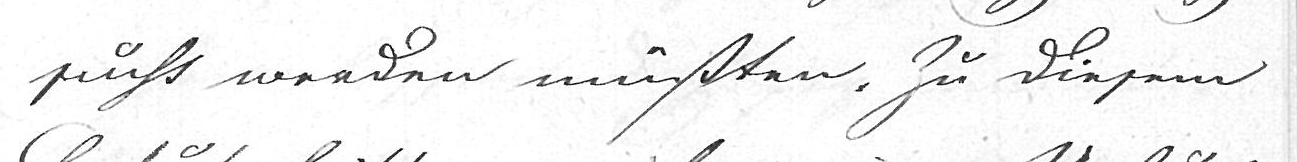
sucht werden müßten. Zu diesem
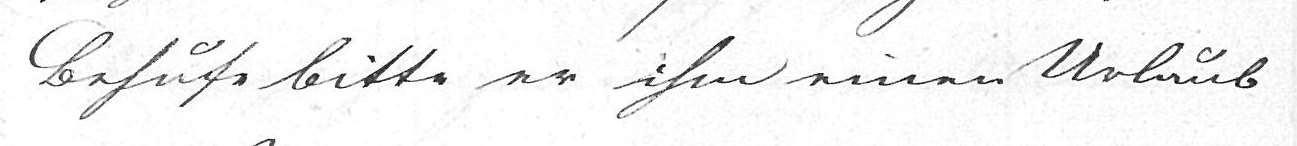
Behufe bitte er ihm einen Urlaub
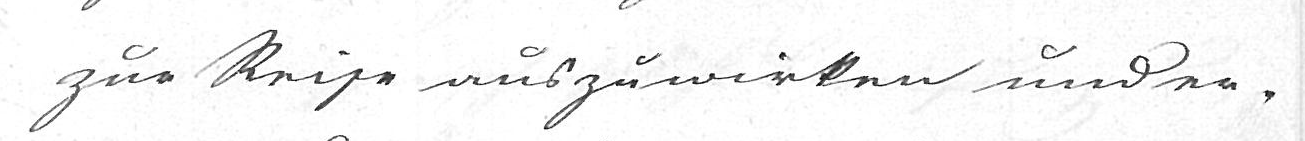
zur Reise auszuwirken und er-
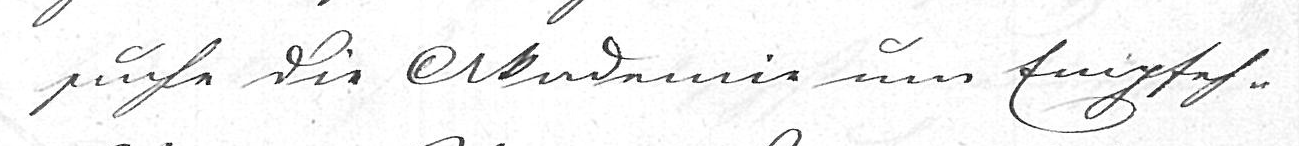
suche die Akademie um Empfeh-
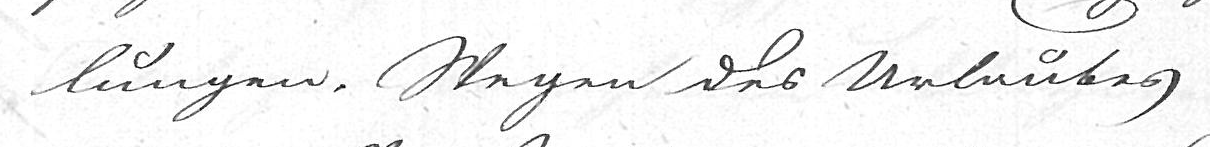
lungen. Wegen des Urlaubes
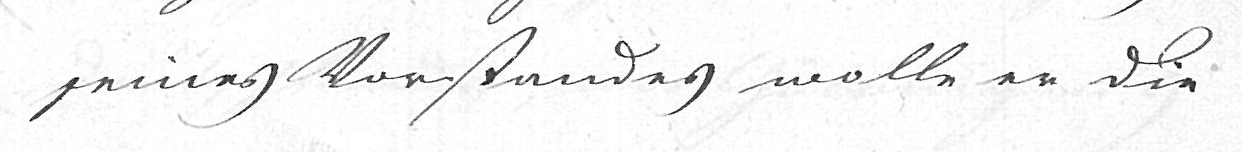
seines Vorstandes wolle er die
